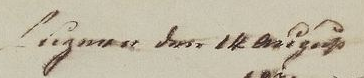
Luzern den 14. August
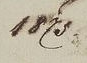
1873.
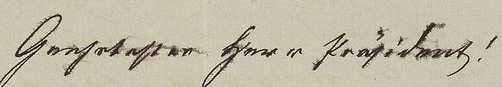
Geehrtester Herr Präsident!
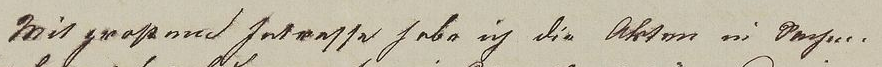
Mit großem Interesse habe ich die Akten in Sachen
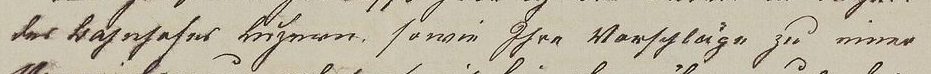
des Bahnhofes Luzern, sowie Ihre Vorschläge zu einer
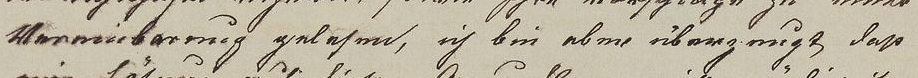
Vereinbarung gelesen, ich bin aber überzeugt, daß
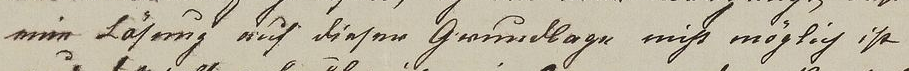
eine Lösung auf dieser Grundlage nicht möglich ist
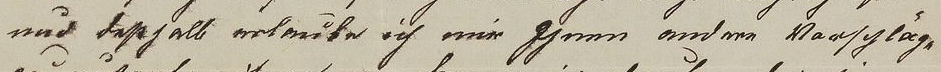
und deßhalb erlaube ich mir Ihnen andere Vorschläge
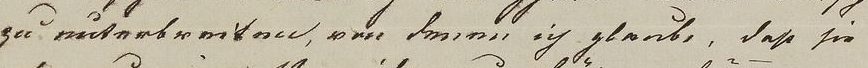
zu unterbreiten, von denen ich glaube, daß sie
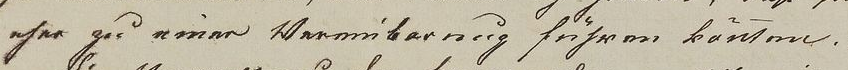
eher zu einer Vereinbarung führen könnten.
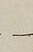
–
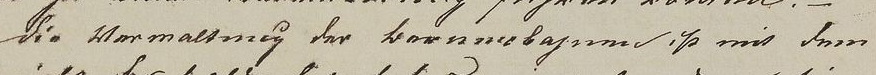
Die Verwaltung der Bernerbahnen ist mit dem
